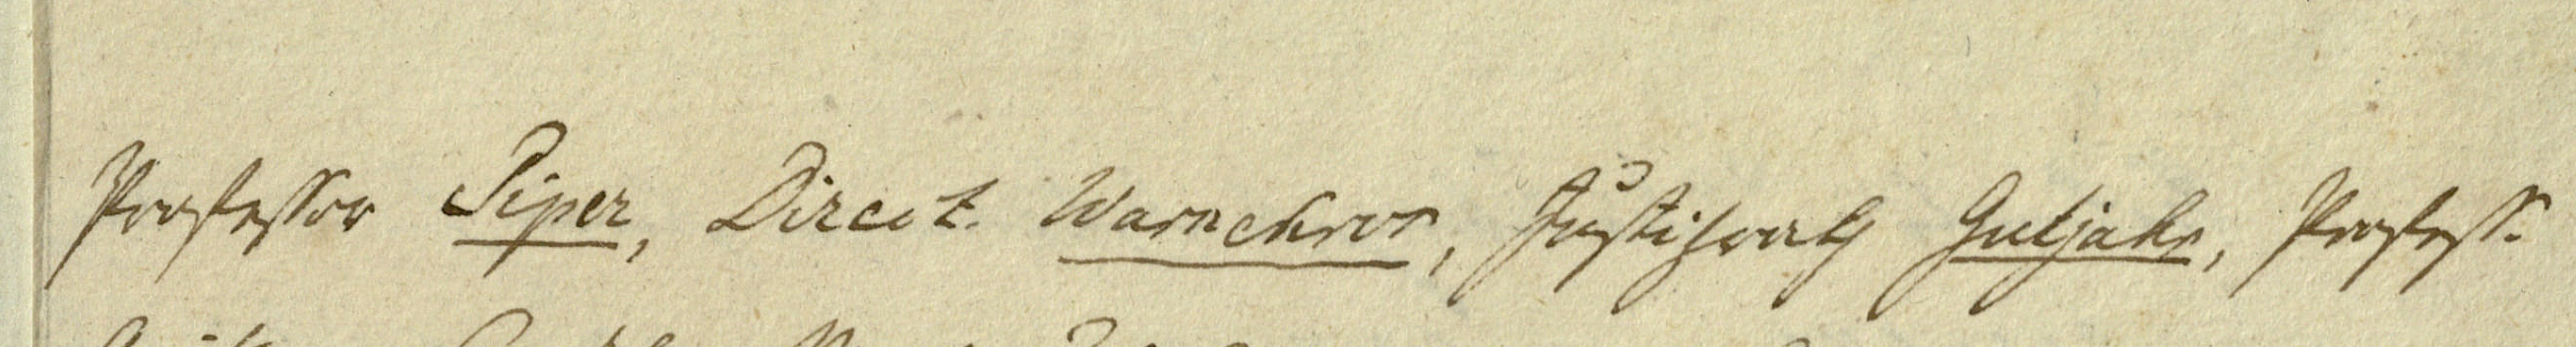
Professor Piper, Direct. Warnekros, Justizrath Gutjahr, Profess.
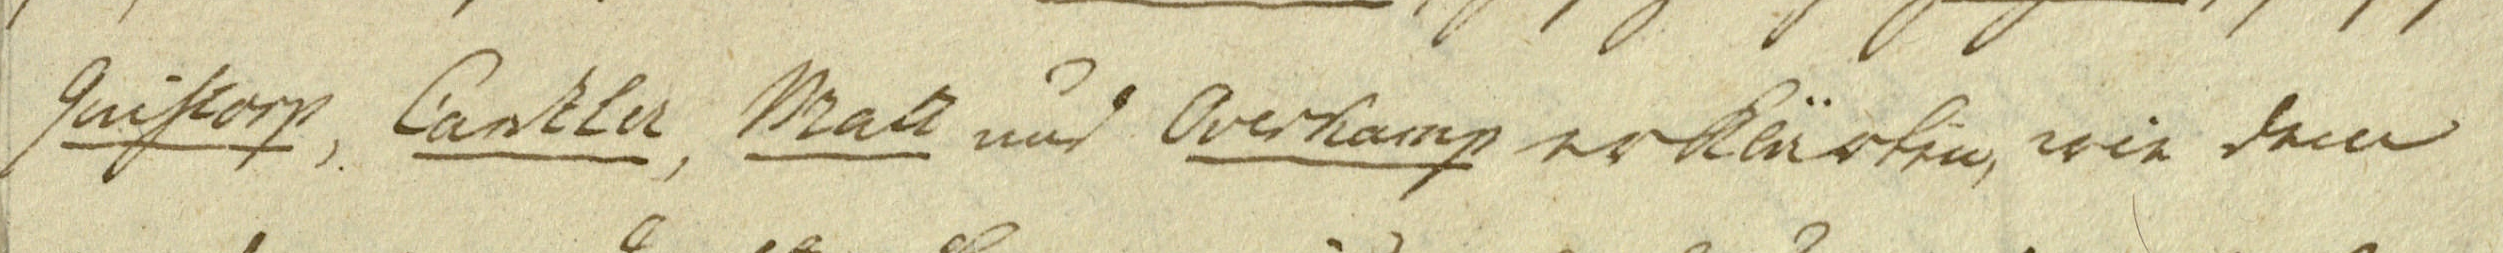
Quistorp, Canzler, Bratt und Overkamp erklärten, wie dem
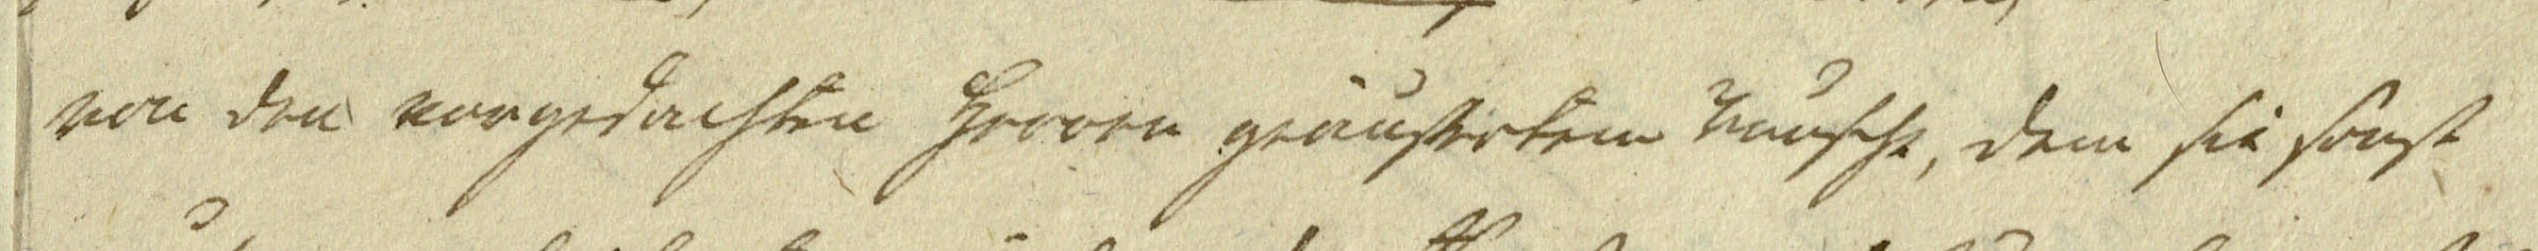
von den vorgedachten Herren geäussertem Wunsche, dem sie sonst
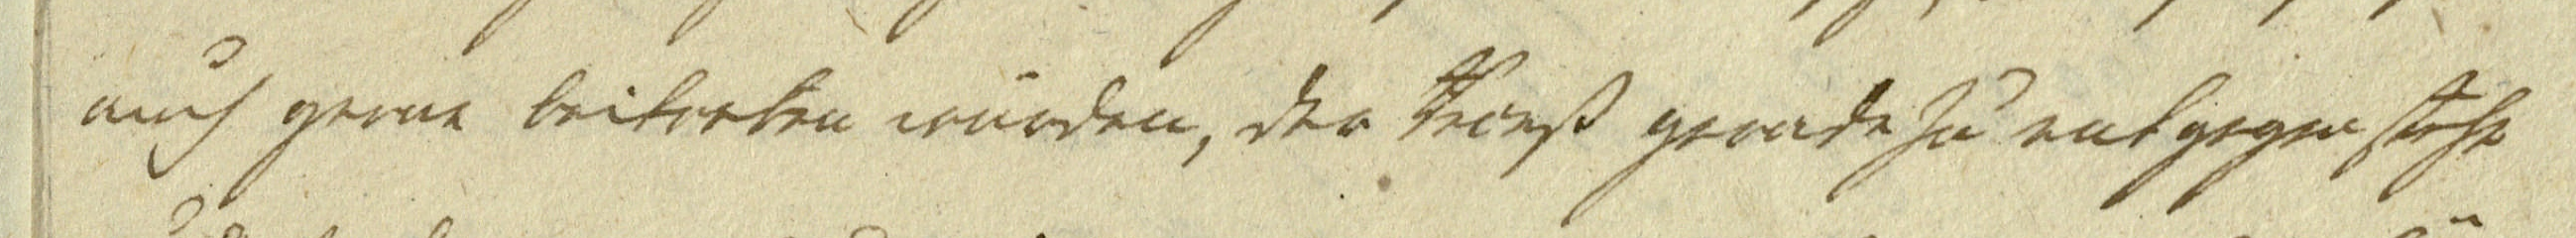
auch gerne beitreten würden, der Receß geradezu entgegen stehe
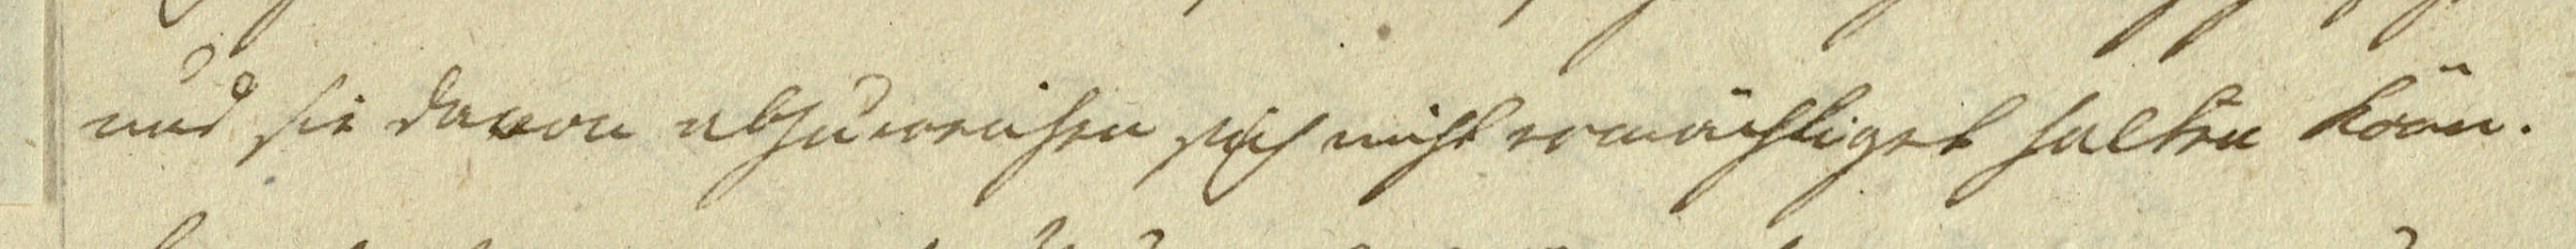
und sie davon abzuweichen sich nicht ermächtiget halten könn¬
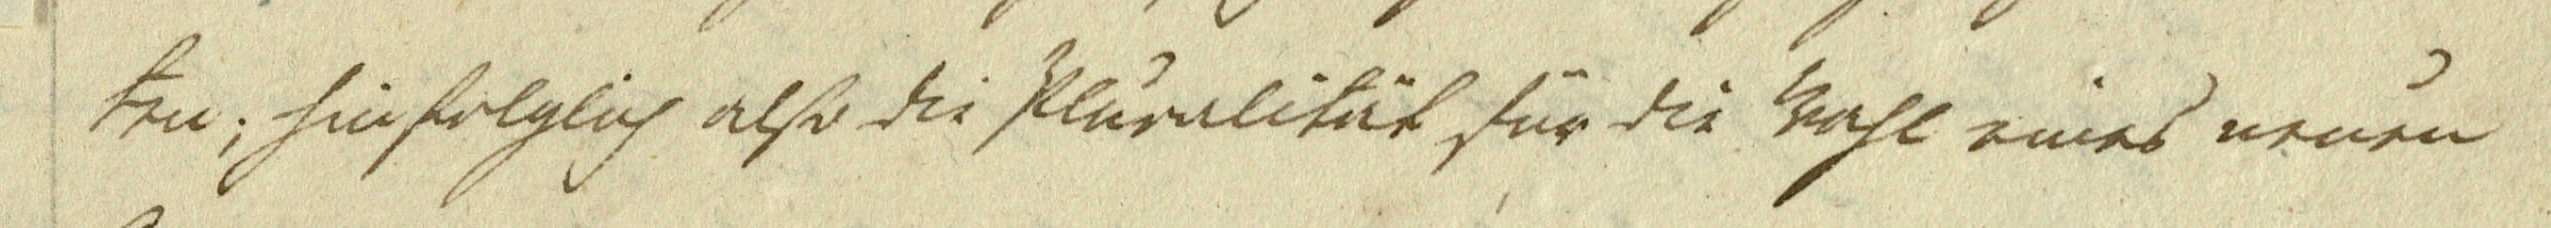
ten, hinfolglich also die Pluralität für die Wahl eines neuen
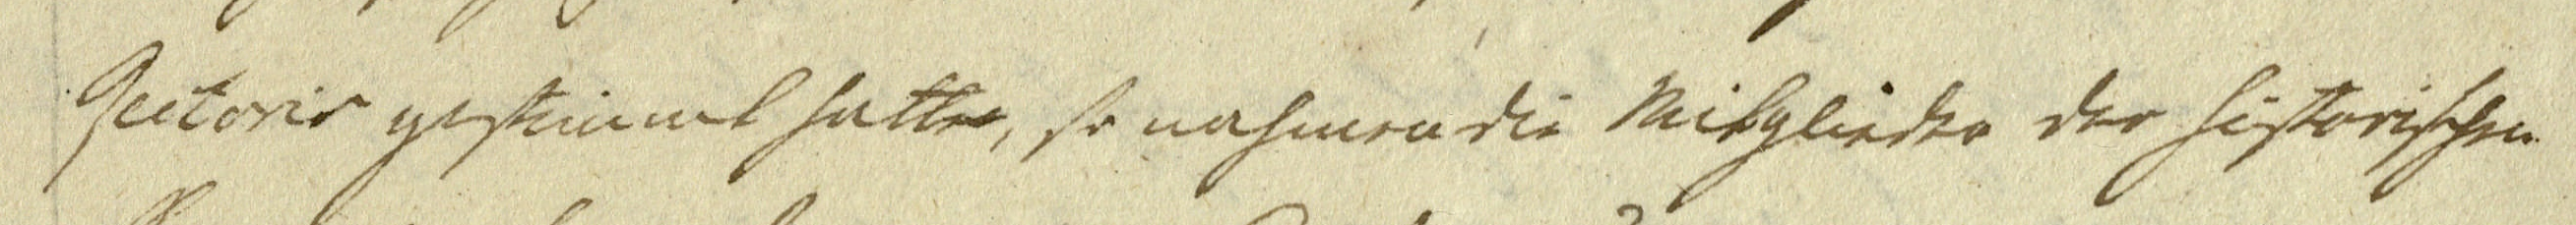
Rectoris gestimmt hätte, so nahmen die Mitglieder der historischen
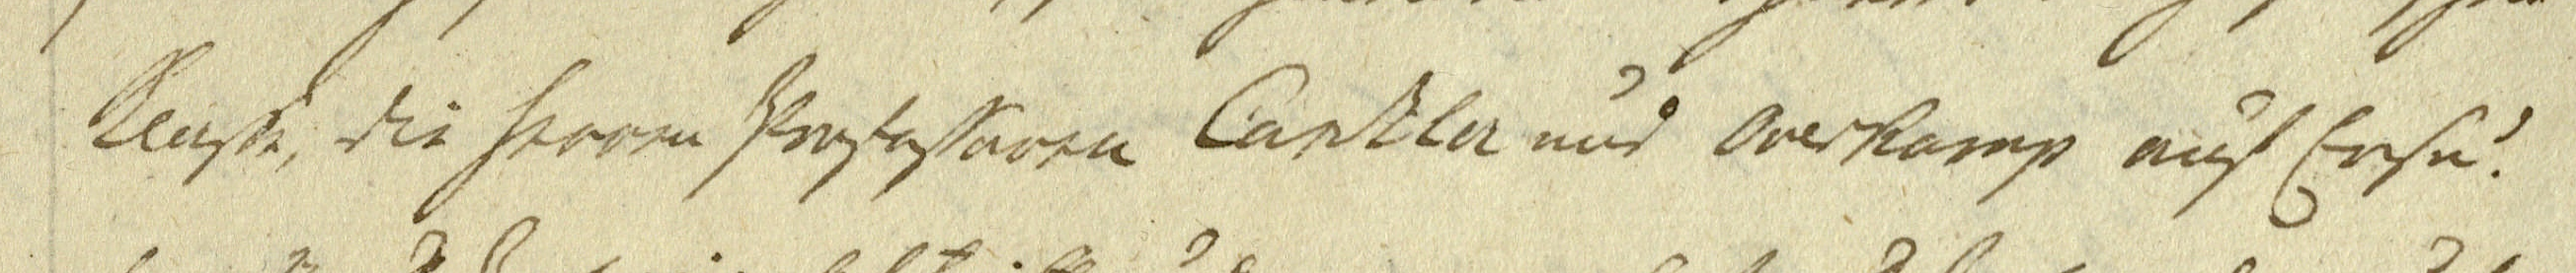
Klasse, die Herren Professoren Canzler und Overkamp auf Ersu¬
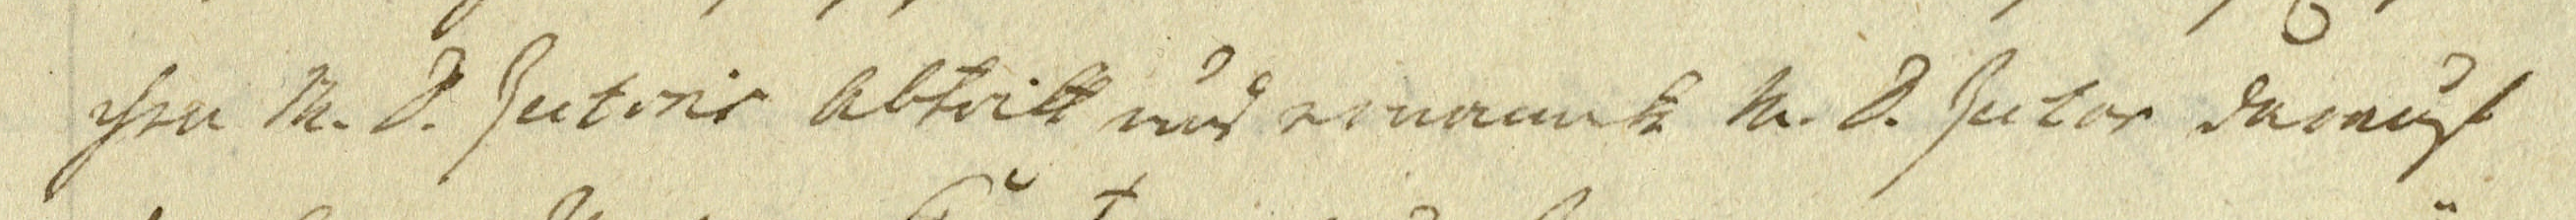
chen M. D. Rectoris Abtritt und ernannte M. D. Rector darauf
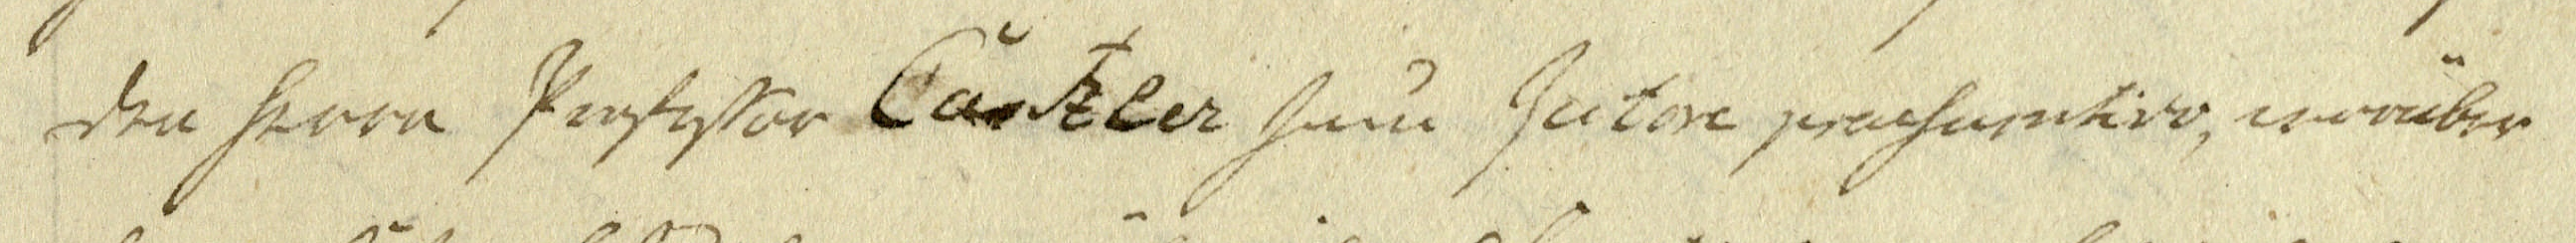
den Herrn Professor Canzler zum Rectore praesumtivo, worüber
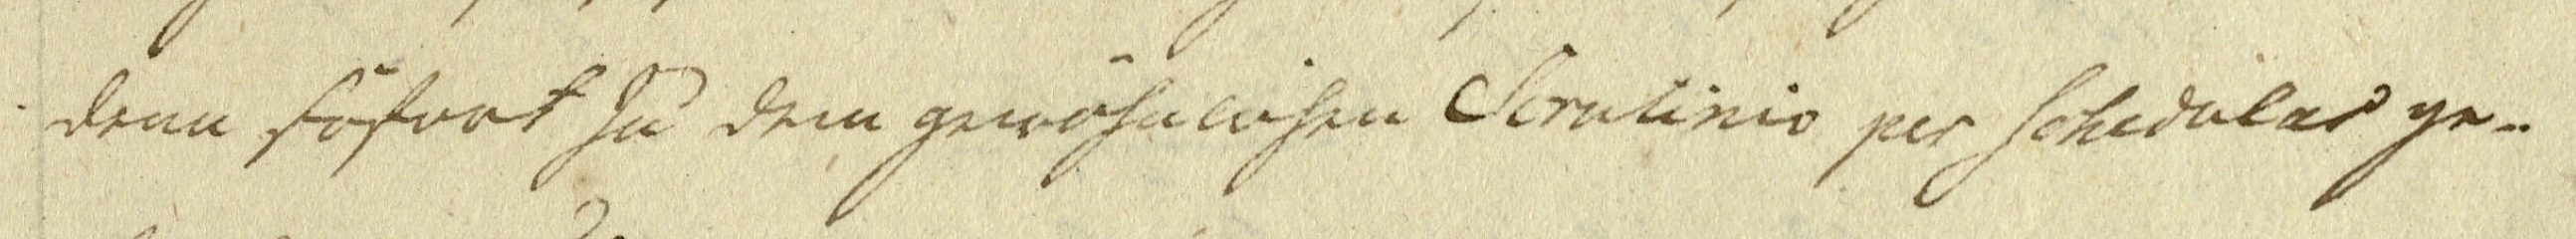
denn sofort zu dem gewöhnlichen Scrutinio per schedulas ge¬
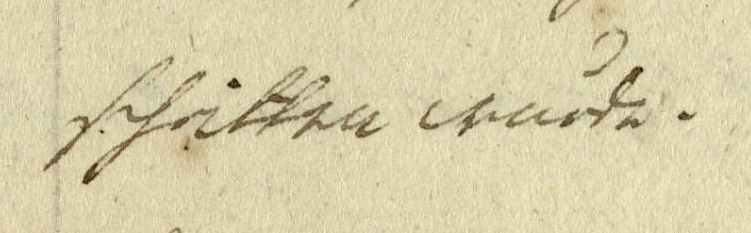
schritten wurde.
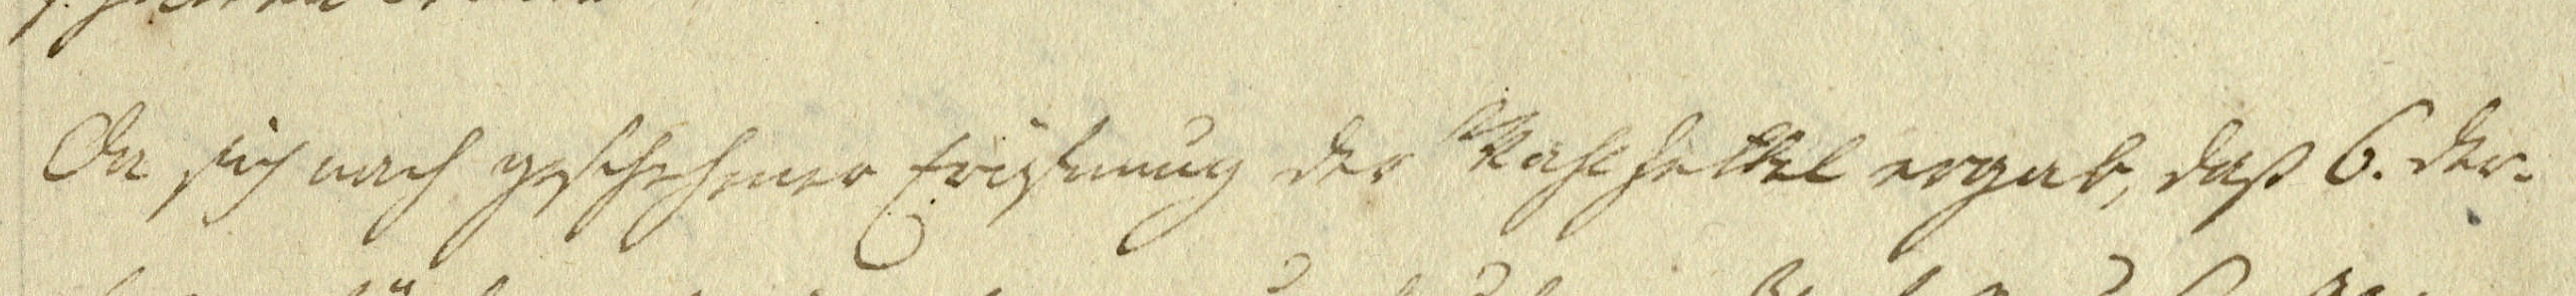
Da sich nach geschehener Eröfnung der Wahl Zettel ergab, daß 6. der¬
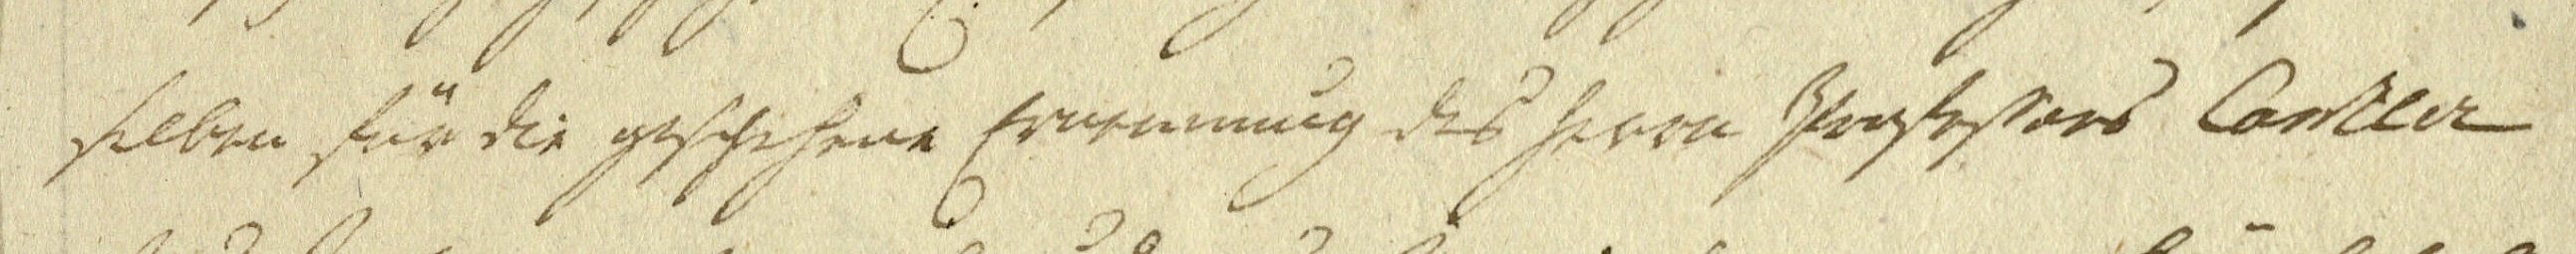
selben für die geschehene Ernennung des Herrn Professors Canzler
